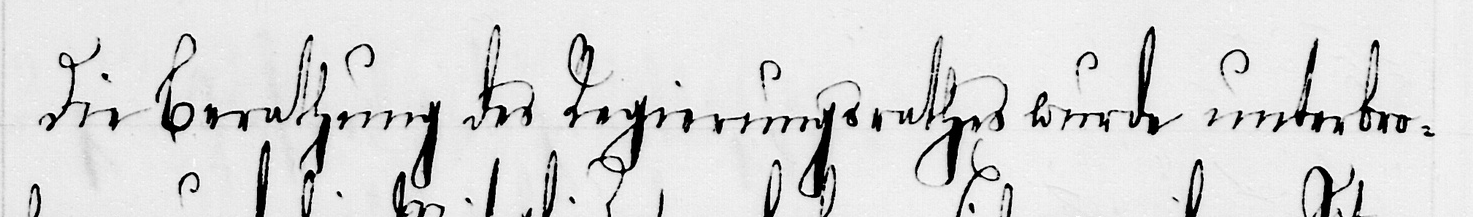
Die Berathung des Regierungsrathes wurde unterbro¬
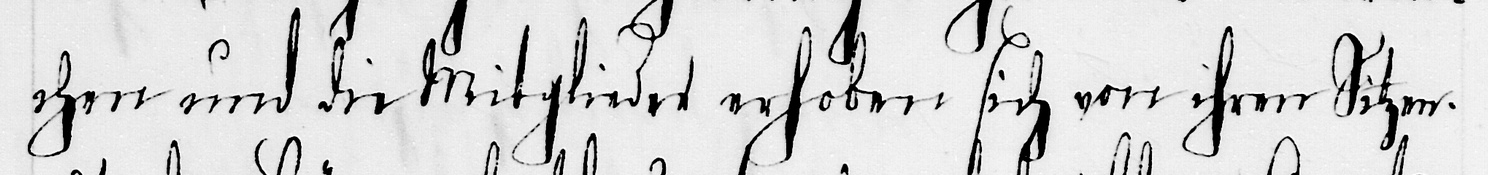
chen und die Mitglieder erhoben sich von ihren Sitzen.
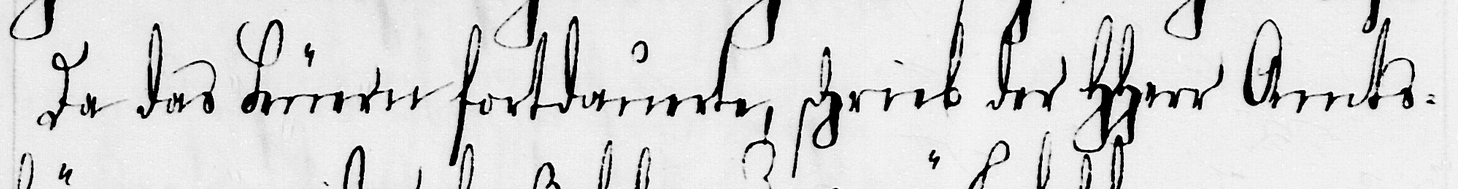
Da das Feuern fortdauerte, schrieb der HHerr Amts¬
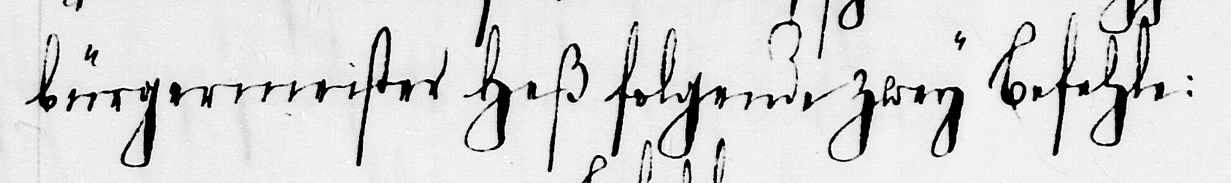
bürgermeister Heß folgende zwey Befehle:
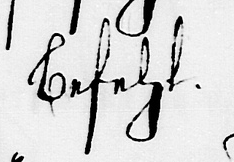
Befehl.
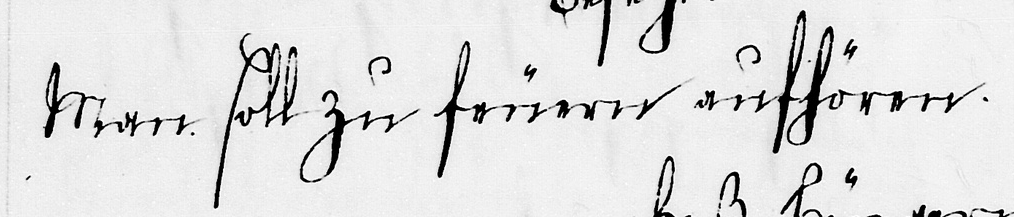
Man soll zu feuern aufhören.
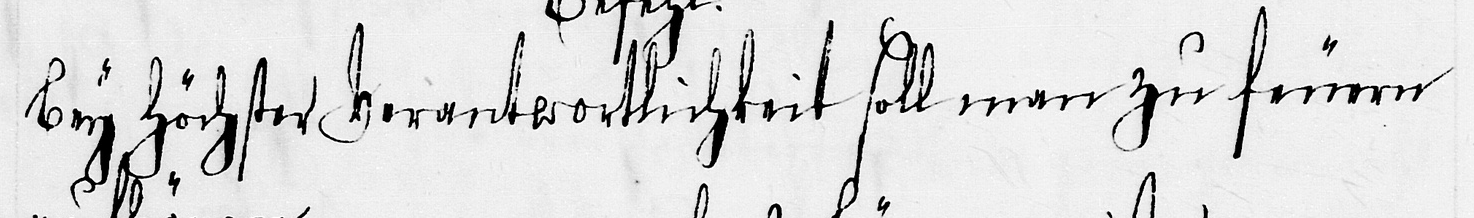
Bey Höchster Verantwortlichkeit soll man zu feuern
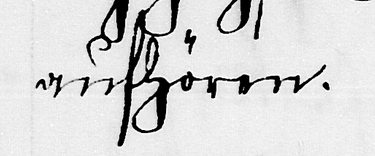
aufhören.
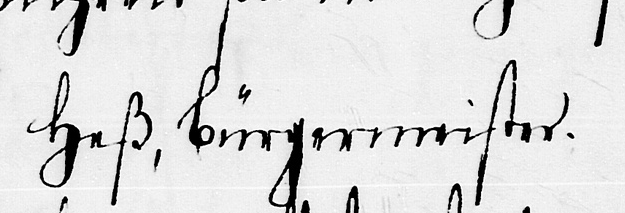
Heß, Bürgermeister.
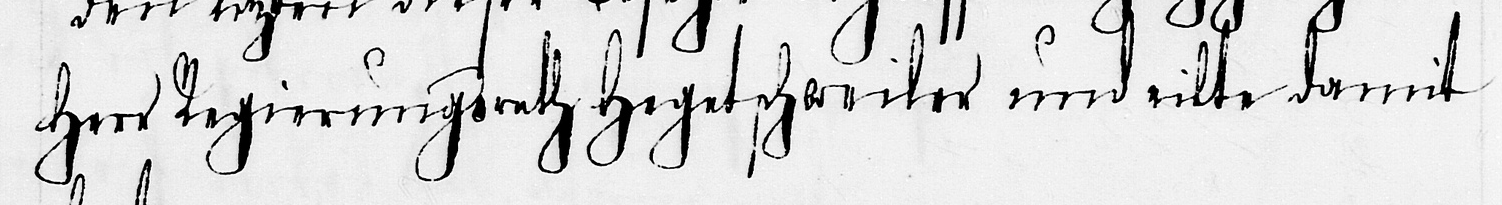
Herr Regierungsrath Hegetschweiler und eilte damit
